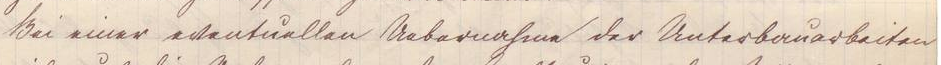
Bei einer eventuellen Uebernahme der Unterbauarbeiten
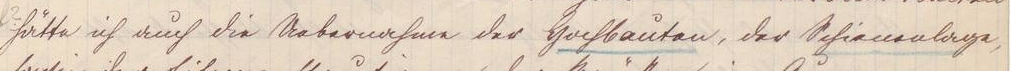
hätte ich auch die Uebernahme der Hochbauten, der Schienenlage,
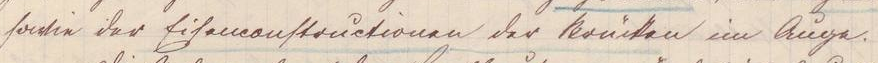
sowie der Eisenconstructionen der Brücken im Auge.
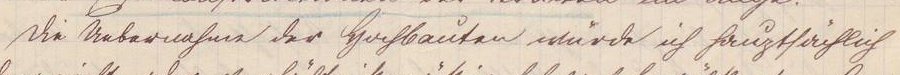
Die Uebernahmen der Hochbauten würde ich hauptsächlich
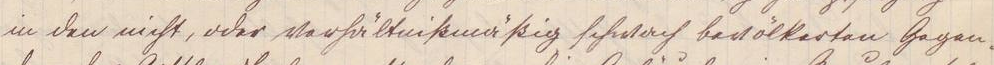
in den nicht, oder verhältnißmäßig schwach bevölkerten Gegen-
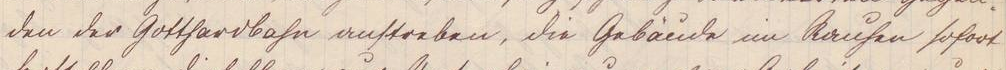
den der Gotthardbahn anstreben, die Gebäude im Rauhen sofort
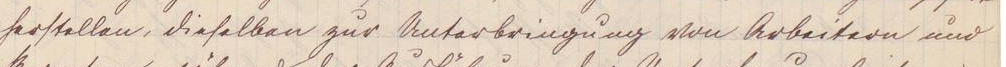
herstellen, dieselben zur Unterbringung von Arbeitern und
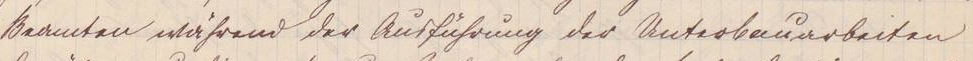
Beamten während der Ausführung der Unterbauarbeiten
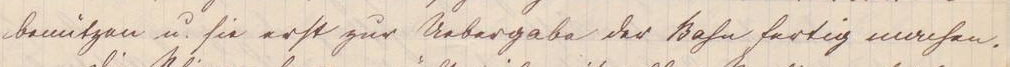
benützen u. sie erst zur Uebergabe der Bahn fertig machen.
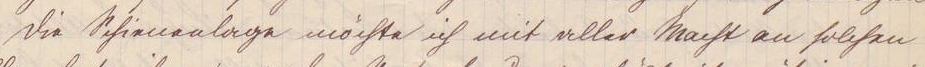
Die Schienenlage möchte ich mit aller Macht an solchen
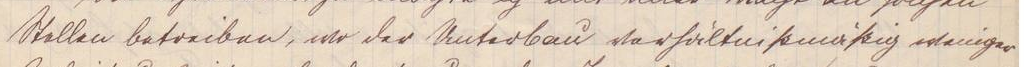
Stellen betreiben, wo der Unterbau verfältnißmäßig weniger
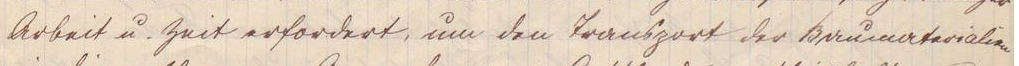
Arbeit u. Zeit erfordert, um den Transport der Baumaterialien
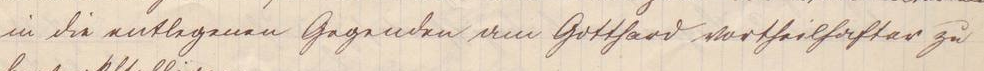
in die entlegenen Gegenden am Gotthard vortheilhafter zu
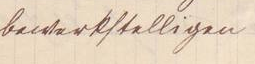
bewerkstelligen.
